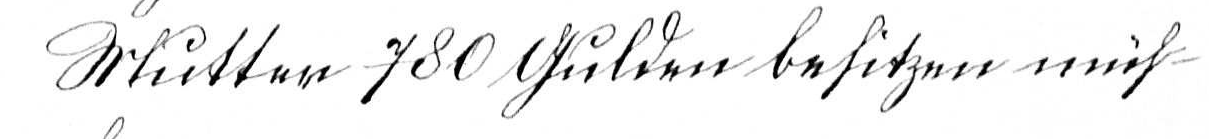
Mutter 780 Gulden besitzen müs¬
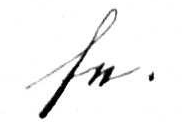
se.
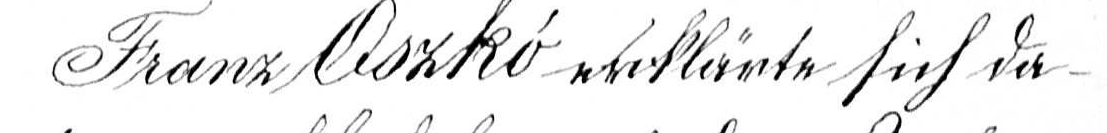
Franz Oszkó erklärte sich da¬
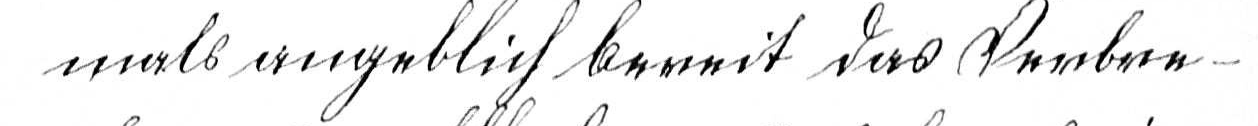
mals angeblich bereit das Verbre¬
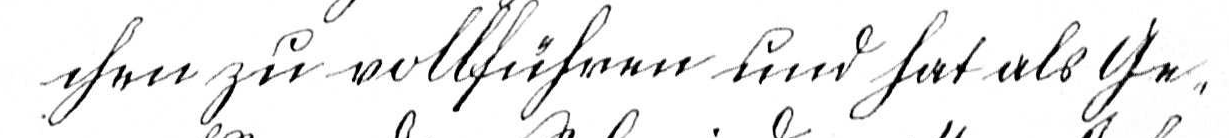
chen zu vollführen und hat als Ge¬
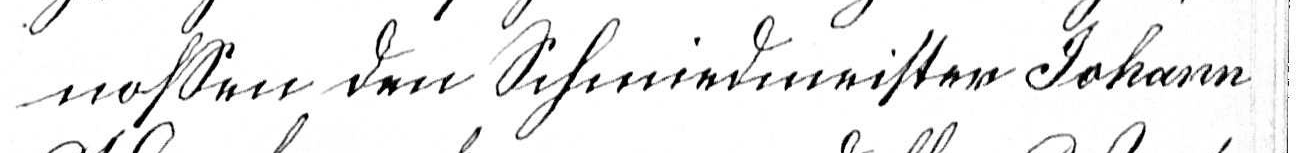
noßen den Schmiedmeister Johann
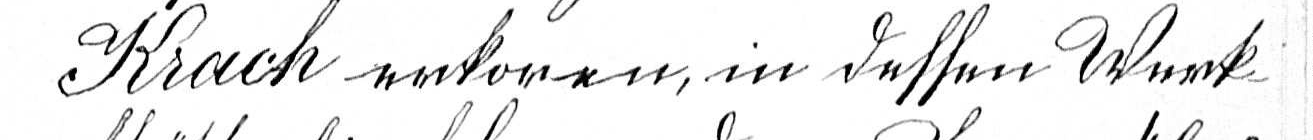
Krach erkoren, in dessen Werk¬
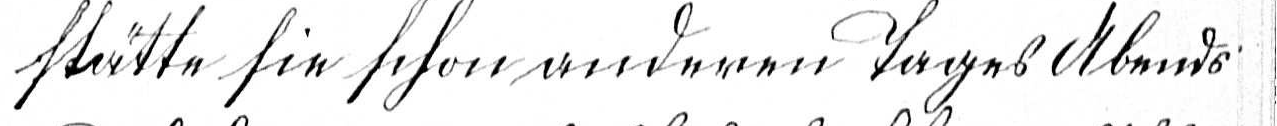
stätte sie schon anderen Tages Abends
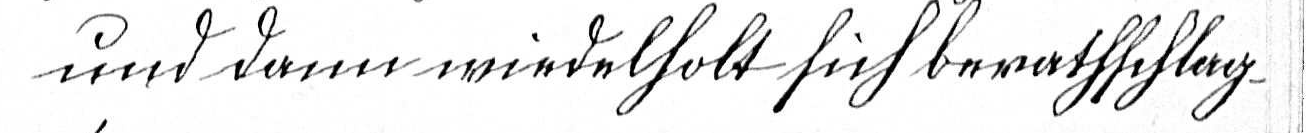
und dann wiedelholt sich berathschag¬
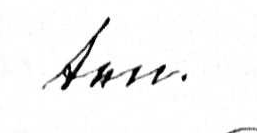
ten.
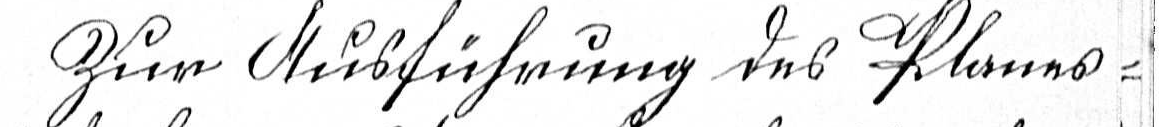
Zur Ausführung des Planes
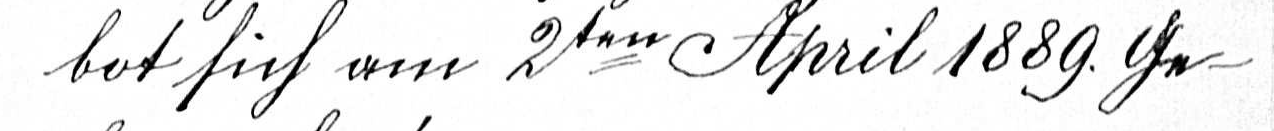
bot sich am 2ten April 1889 Ge¬
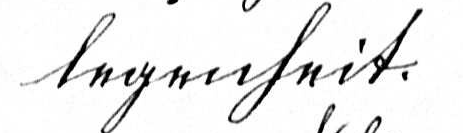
legenheit.
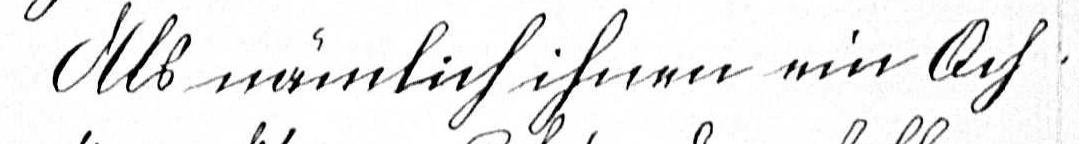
Als nämlich ihnen ein Och¬
